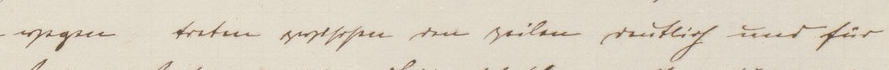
wegen treten zwischen den Zeilen deutlich und für
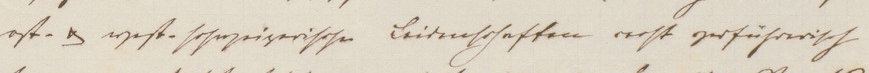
ost– & west–schweizerische Leidenschaften recht verführerisch
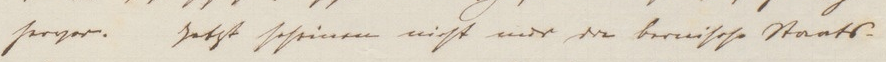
hervor. Jetzt scheinen nicht nur die bernische Staats-
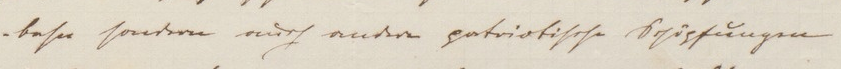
bahn sondern auch andere patriotische Schöpfungen
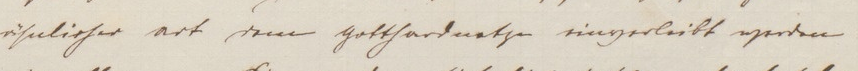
ähnlicher Art dem Gotthardnetze einverleibt werden
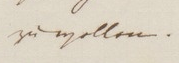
zu wollen.
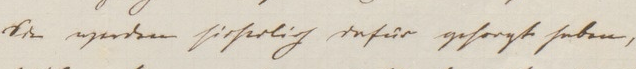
Sie werden sicherlich dafür gesorgt haben,
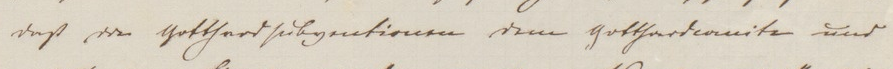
daß die Gotthardsubventionen dem Gotthardcomite und
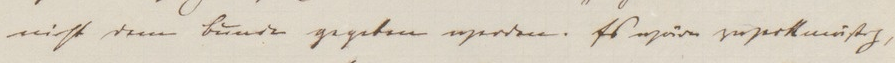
nicht dem Bunde gegeben werden. Es wäre zweckmäßig,
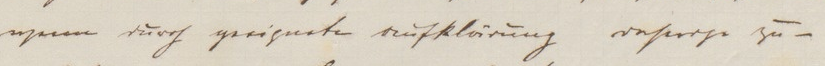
wenn durch geeignete Aufklärung daherige Zu-
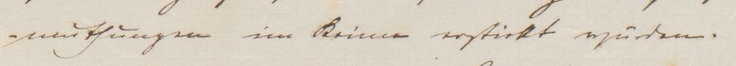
muthungen im Keime erstickt würden.
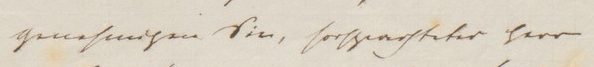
Genehmigen Sie, hochgeachteter Herr
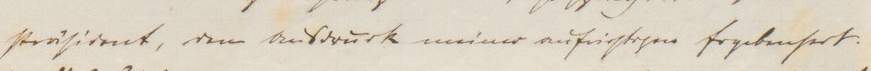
Präsident, den Ausdruck meiner aufrichtigen Ergebenheit.
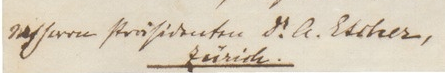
MHHern Präsidenten Dr A Escher,
